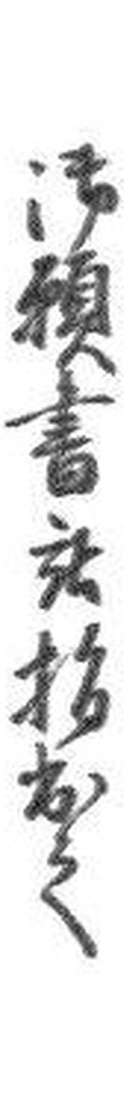御願書被指出之
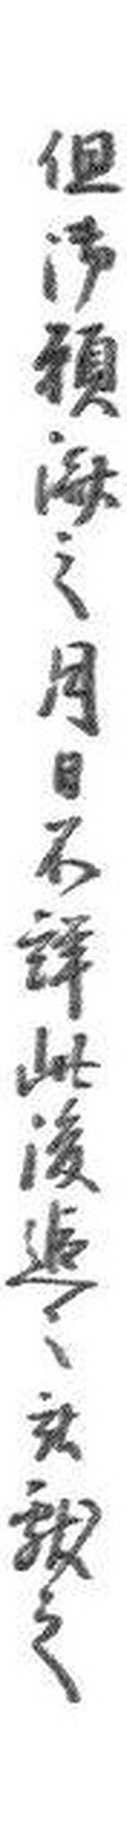但御願済之月日不詳此以後追々被献之
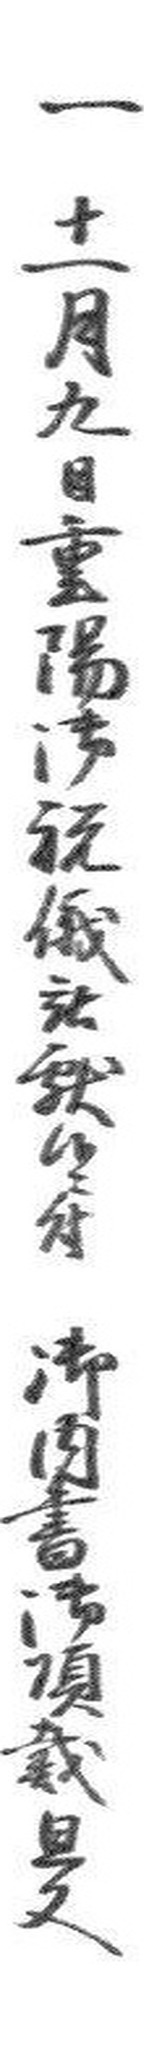一十一月九日重陽御祝儀被献候ニ付御内書御頂戴且又
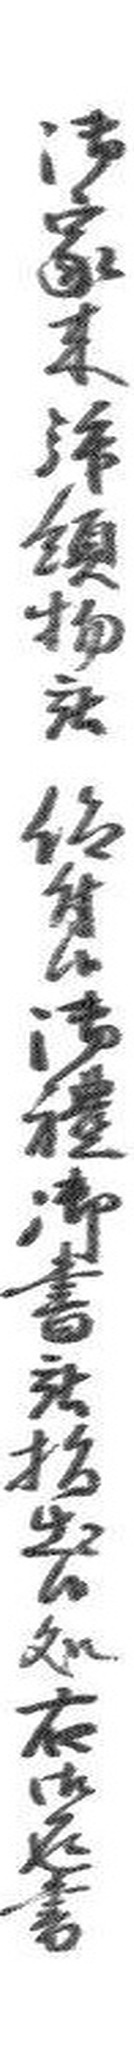御家来拝領物被仰付候御礼御書被指出候処右御返書
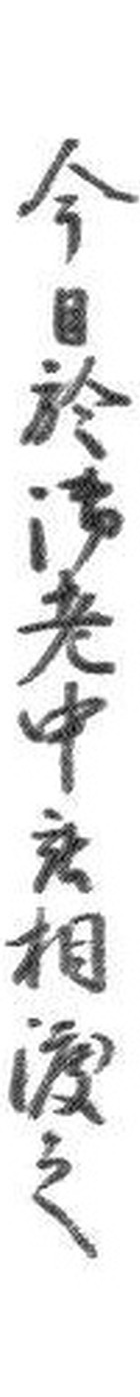今日於御老中被相渡之

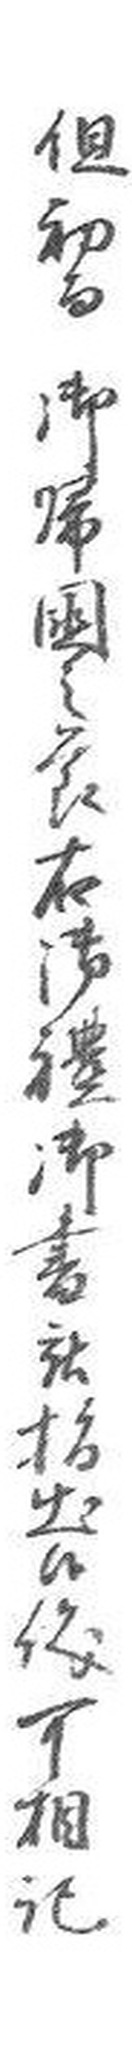但初而御帰国之節右御礼御書被指出候儀可相記
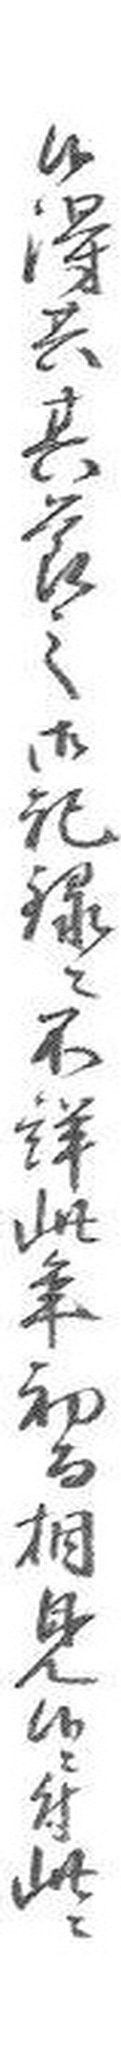候得共其節之御記録ニ不詳此年初而相見候ニ付此ニ
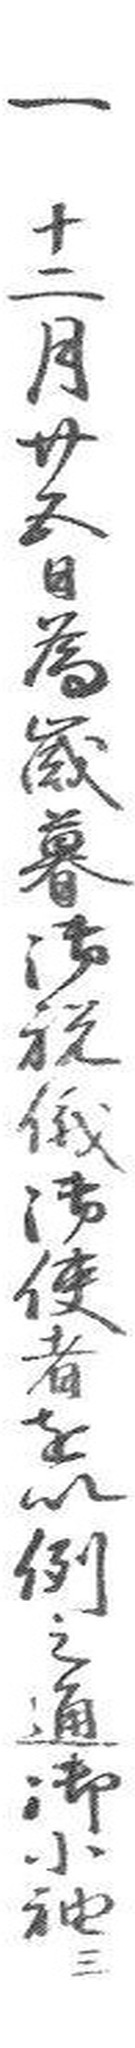一十二月廿五日為歳暮御祝儀御使者を以例之通御小袖三
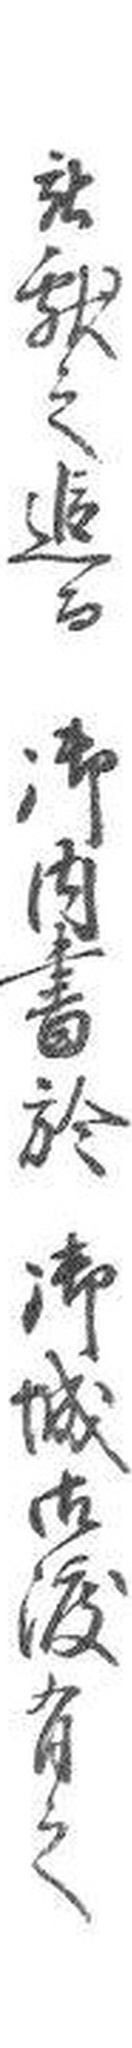被献之追而御内書於御城御渡有之
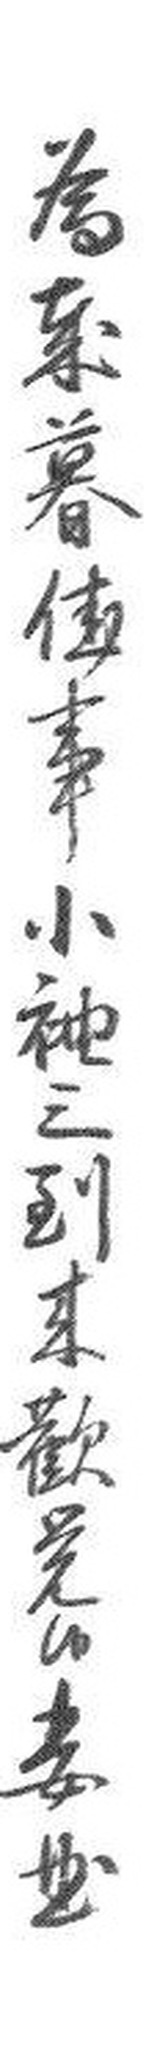為歳暮佳事小袖三到来歓覚候委曲
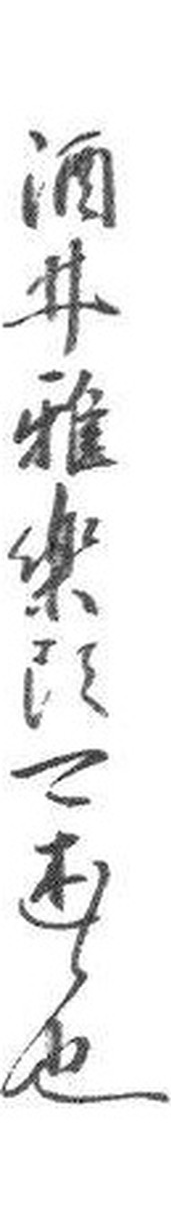酒井雅楽頭可述候也
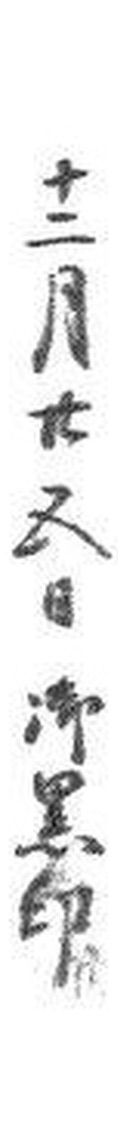十二月廿五日御黒印
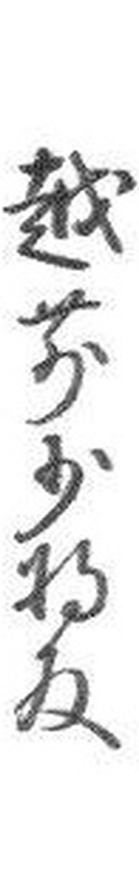越前少将殿

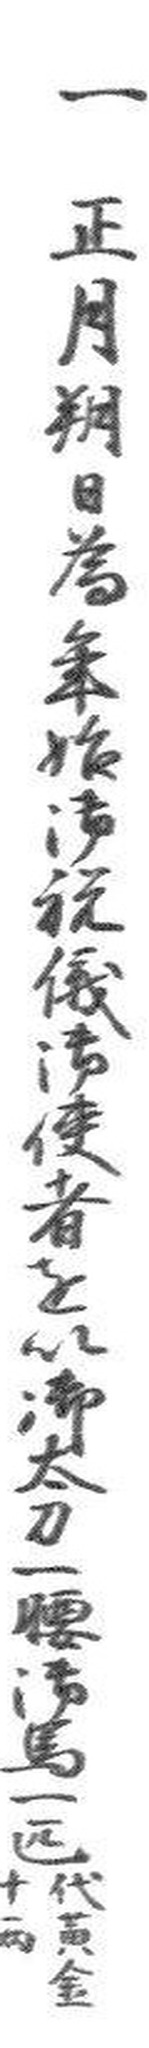一正月朔日為年始御祝儀御使者を以御太刀一腰御馬一匹代黄金十両
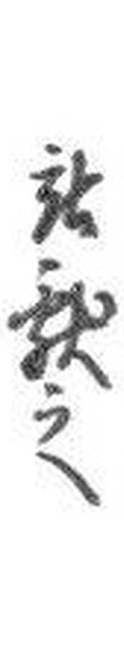被献之
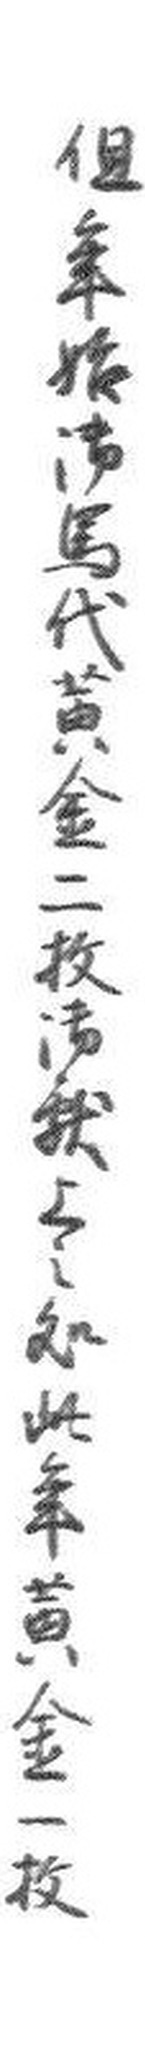但年始御馬代黄金二枚御献上之処此年黄金一枚
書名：家譜 五 光通公 従寛永十三年到万治二年
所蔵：福井県文書館 Fukui Prefectural Archives
